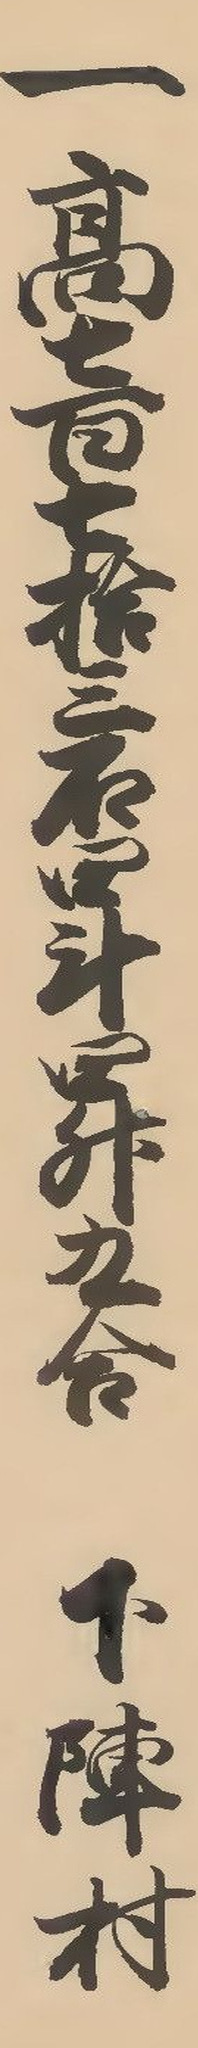一髙七百七拾三石四斗四升九合下陣村
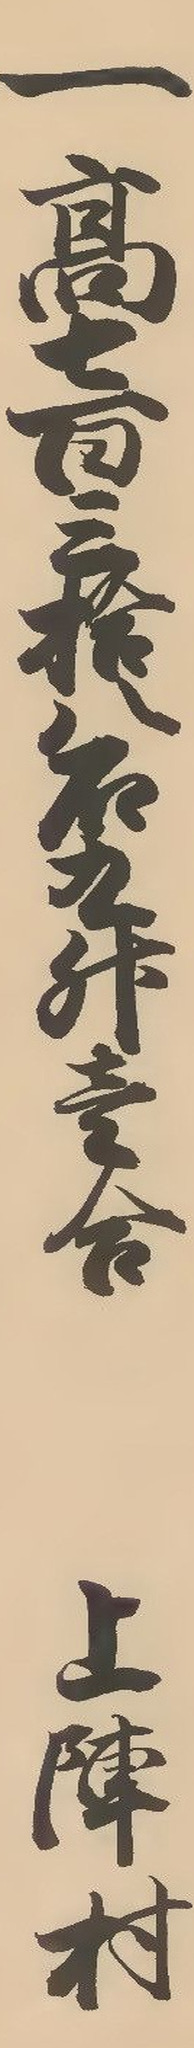一髙七百三拾八石九升壱合上陣村
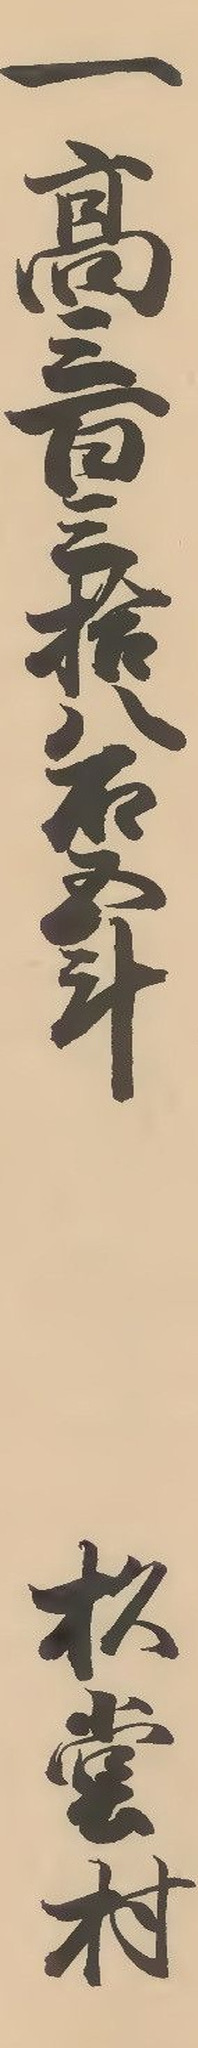一髙三百三拾八石五斗杦堂村
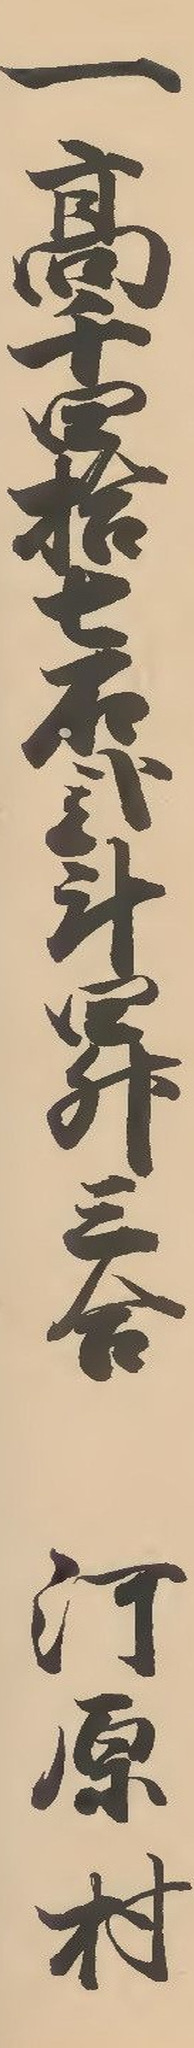一髙千四拾七石弐斗四升三合河原村
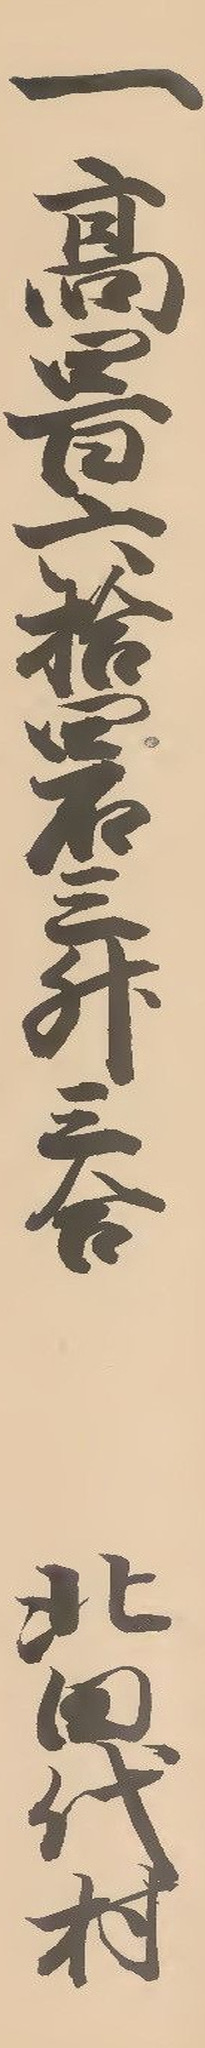一髙四百六拾四石三升三合北田代村
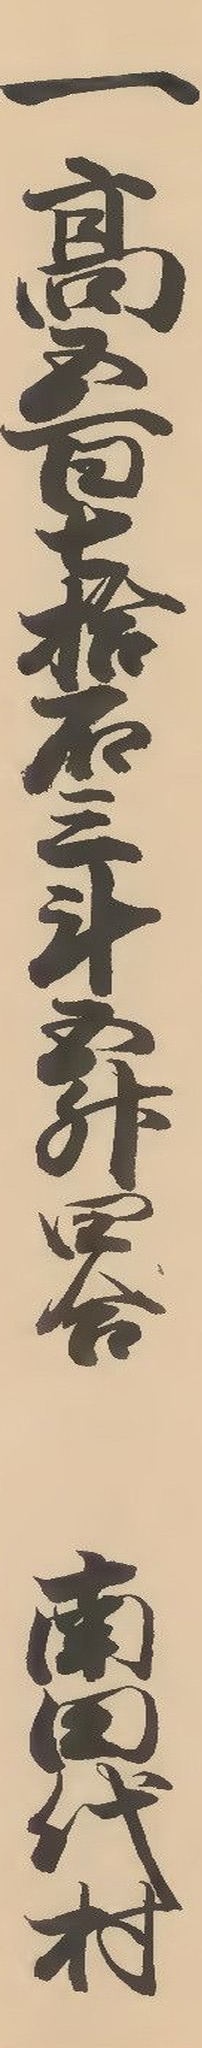一髙五百七拾石三斗五升四合南田代村
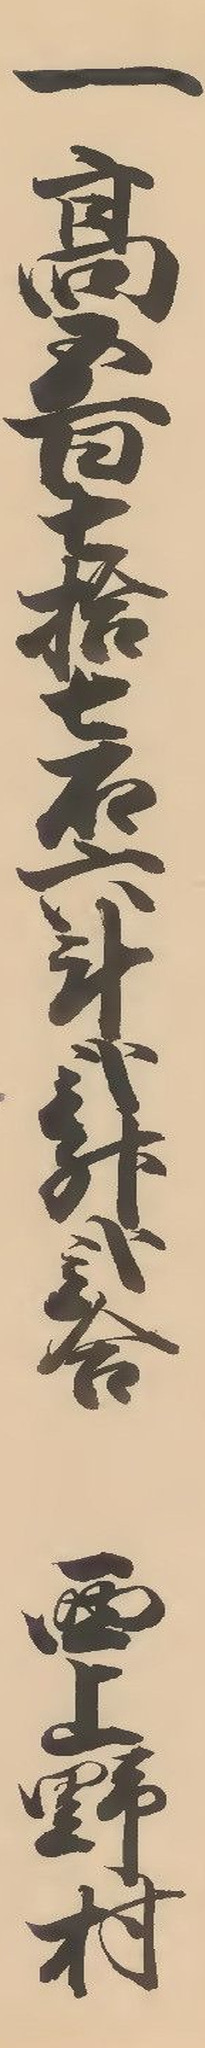一髙五百七拾七石六斗弐升弐合西上野村
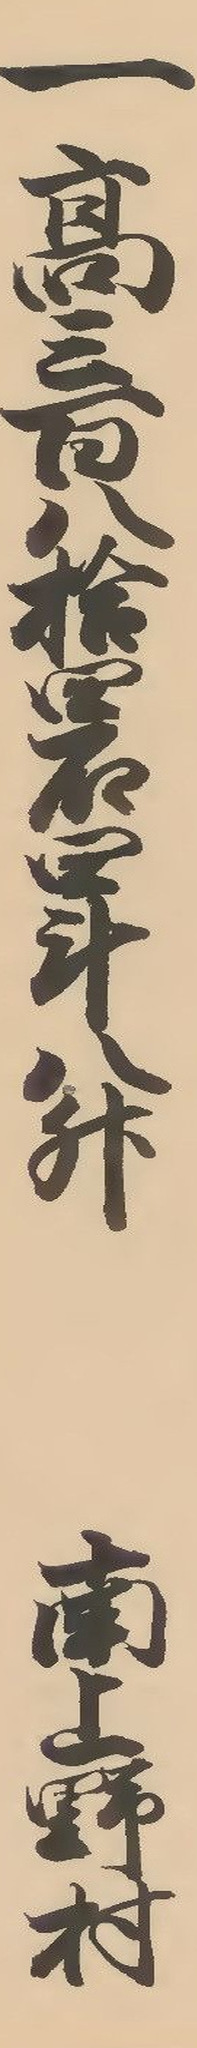一髙三百八拾四石四斗八升南上野村

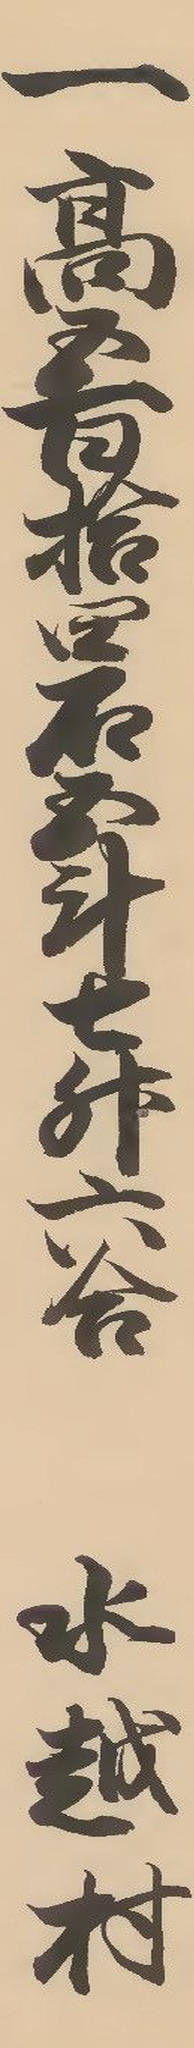一髙五百拾四石五斗七升六合水越村
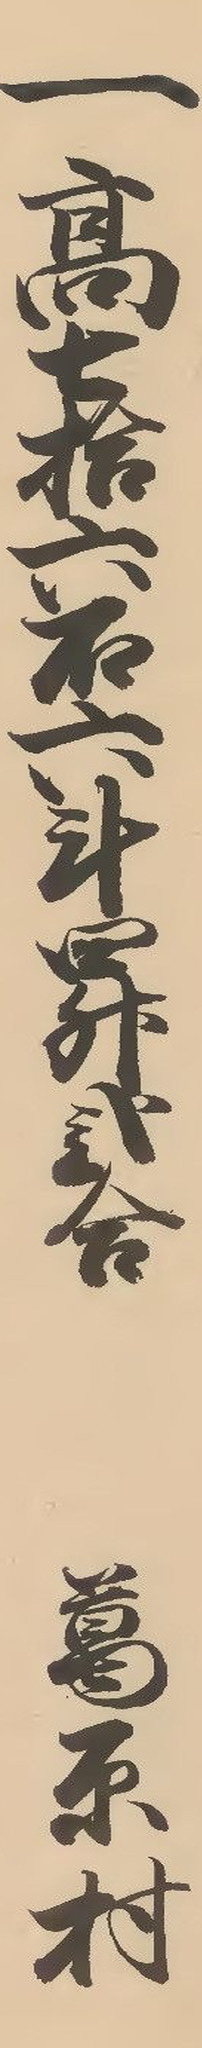一髙七拾六石六斗四升弐合葛原村
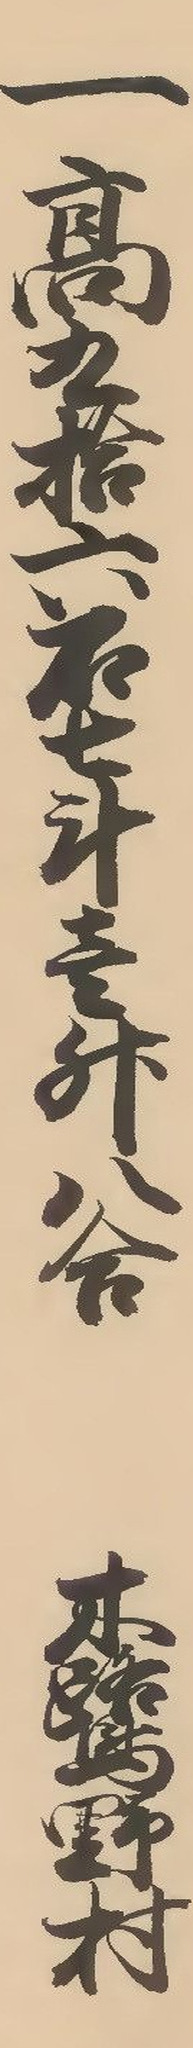一髙九拾六石七斗壱升八合木鷺野村
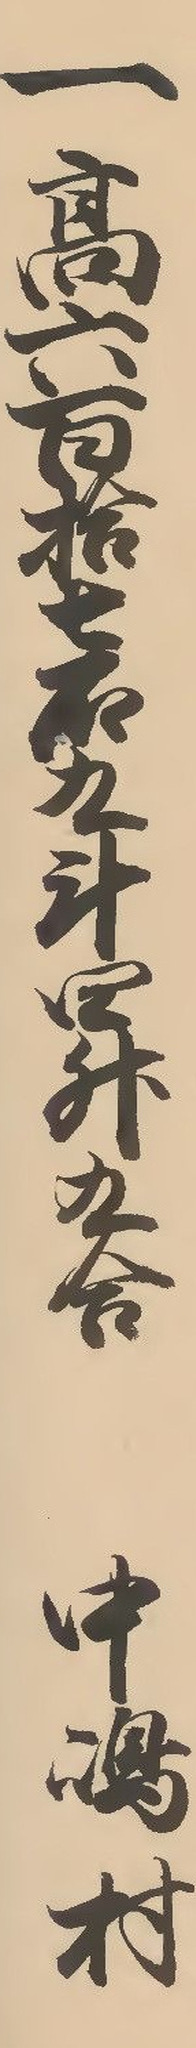一髙六百拾七石九斗四升九合中嶋村
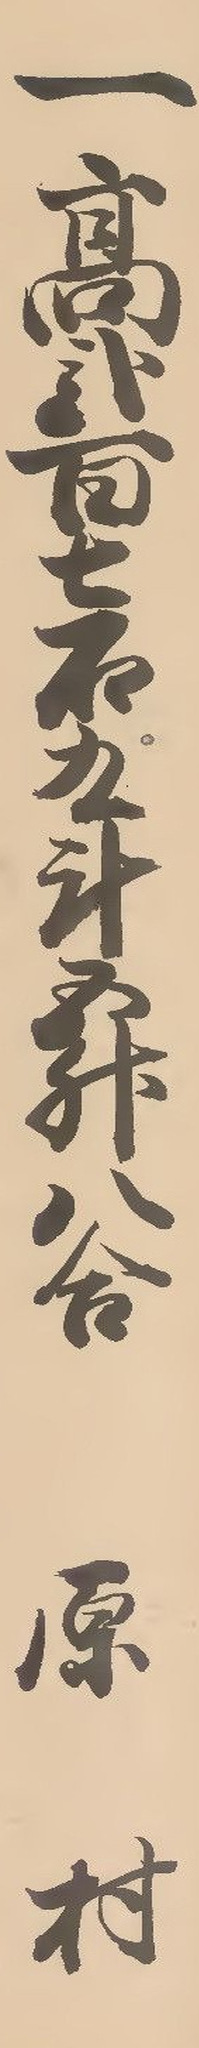一髙弐百七石九斗五升八合原村
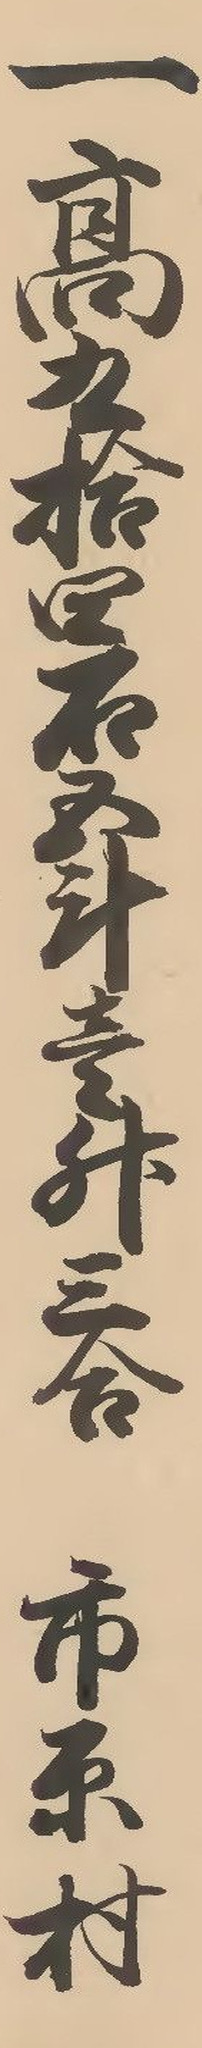一髙九拾四石五斗壱升三合市原村
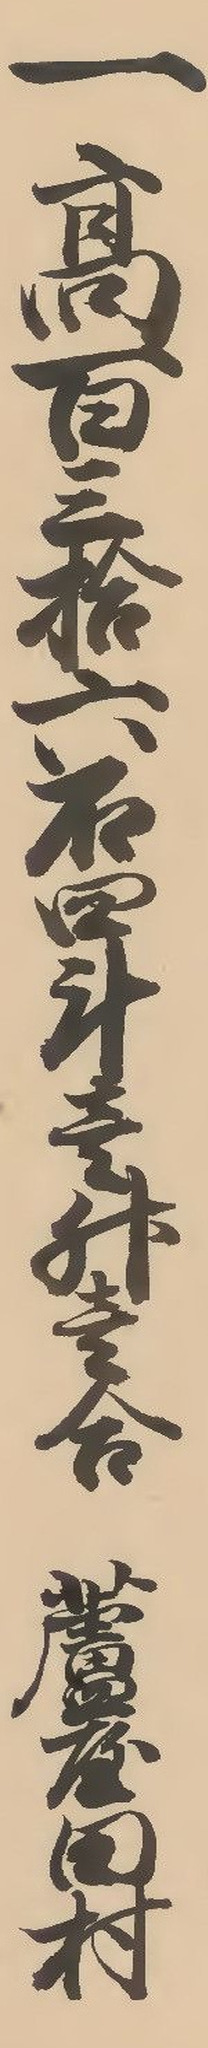一髙百三拾六石四斗壱升壱合蘆屋田村
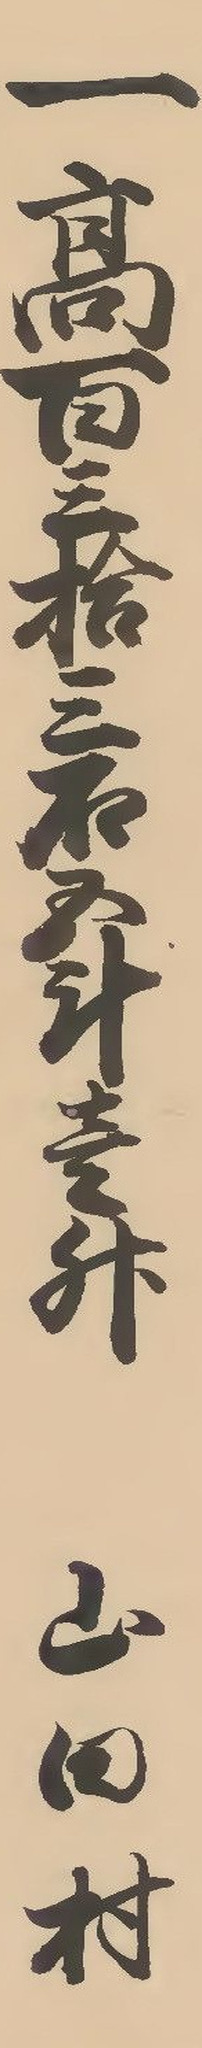一髙百三拾三石五斗壱升山田村
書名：肥後国郷帳
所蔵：国立公文書館 National Archives of Japan
